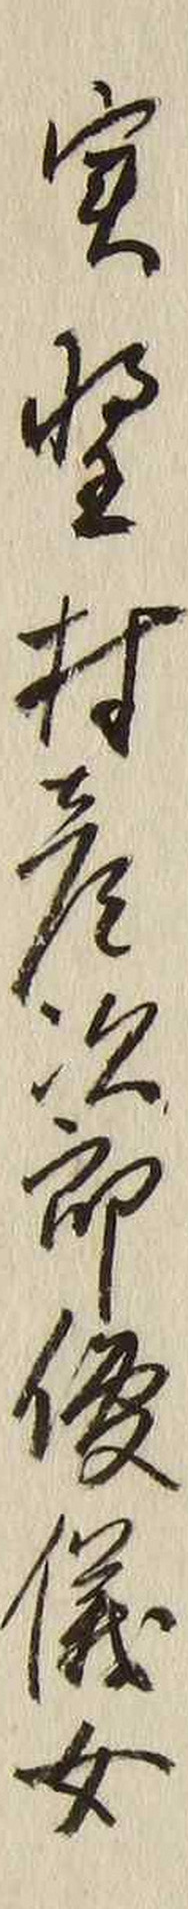実野村彦次郎俊儀女

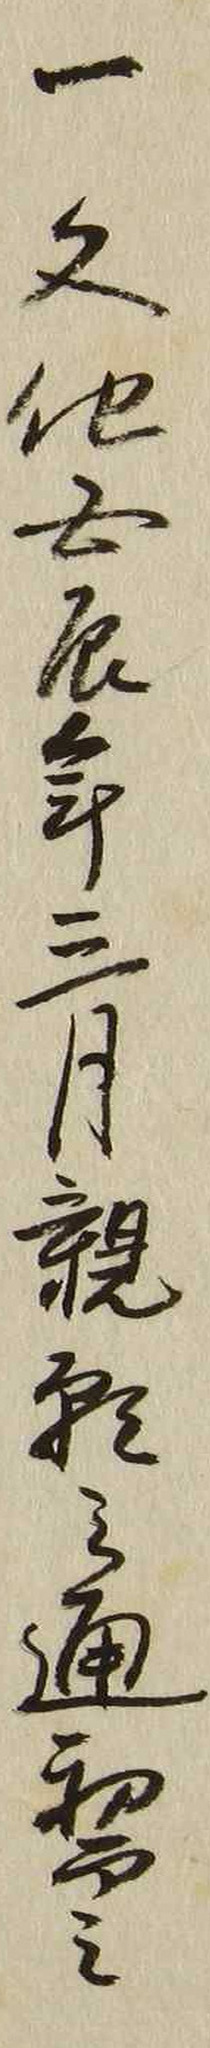一文化五辰年三月親願之通初而之
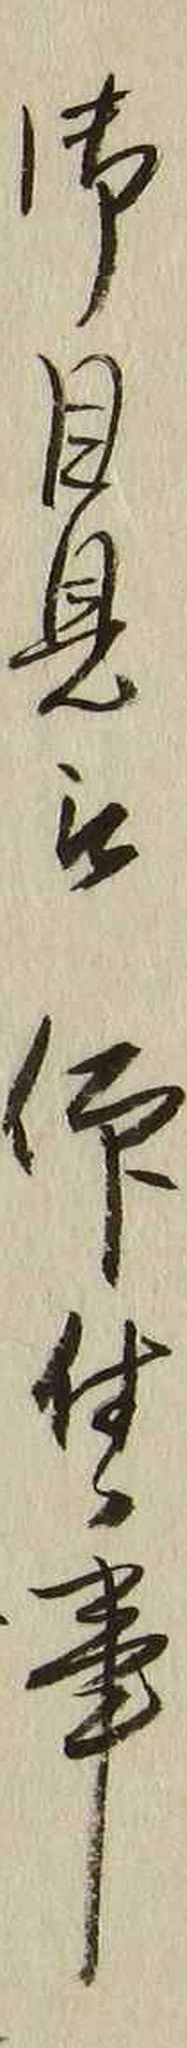御目見被仰付候事
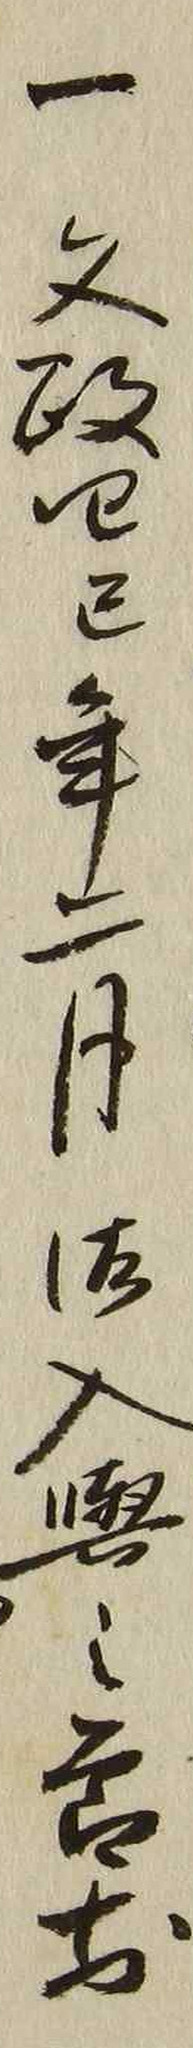一文政四巳年二月御入興之節於
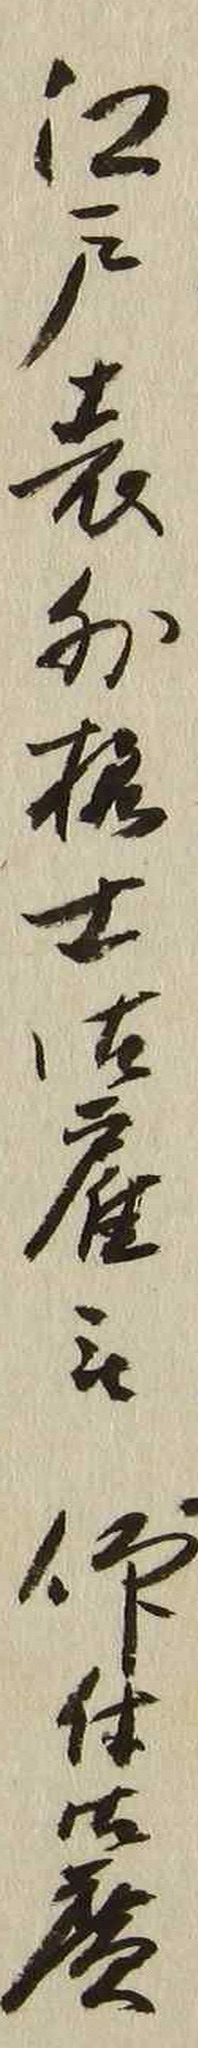江戸表外様士御雇被仰付御広
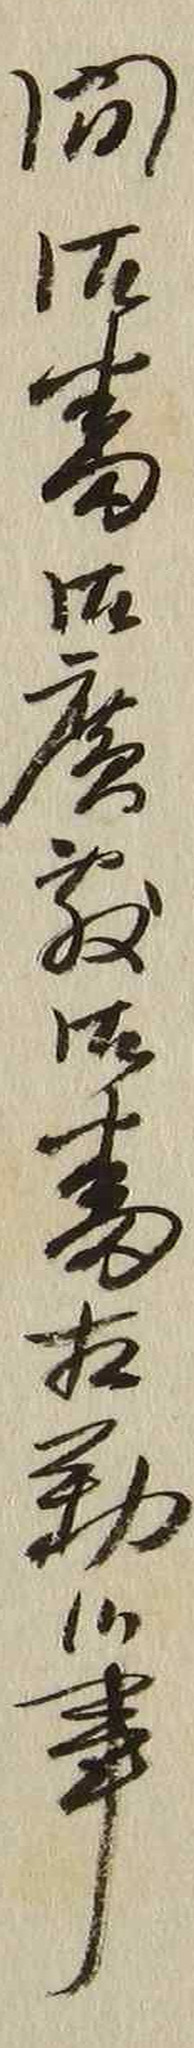間御番御広敷御番相勤事候事
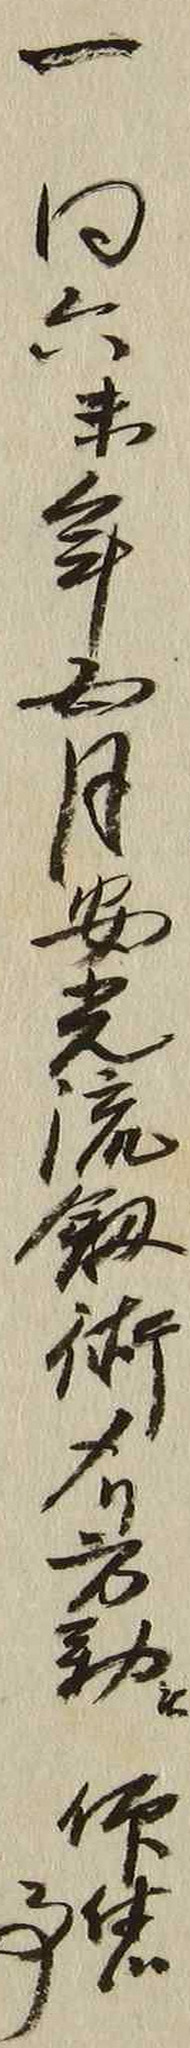一同六未年五月安光流剣術〆り方勤被仰付候事
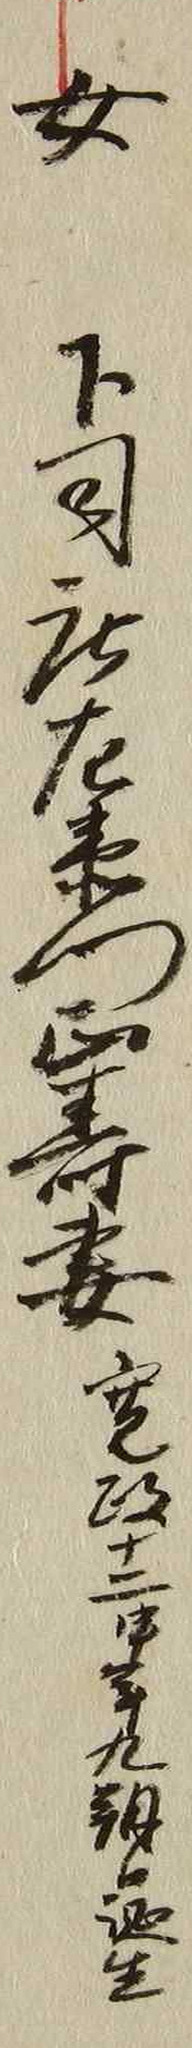女下司庄左衛門正寿妻寛政十二申年九朔日誕生
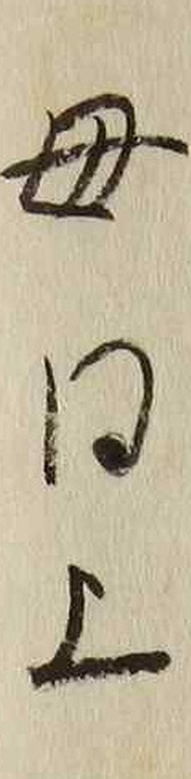母同上
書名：諸士系譜　巻之346　も之部2
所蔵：会津若松市立会津図書館
